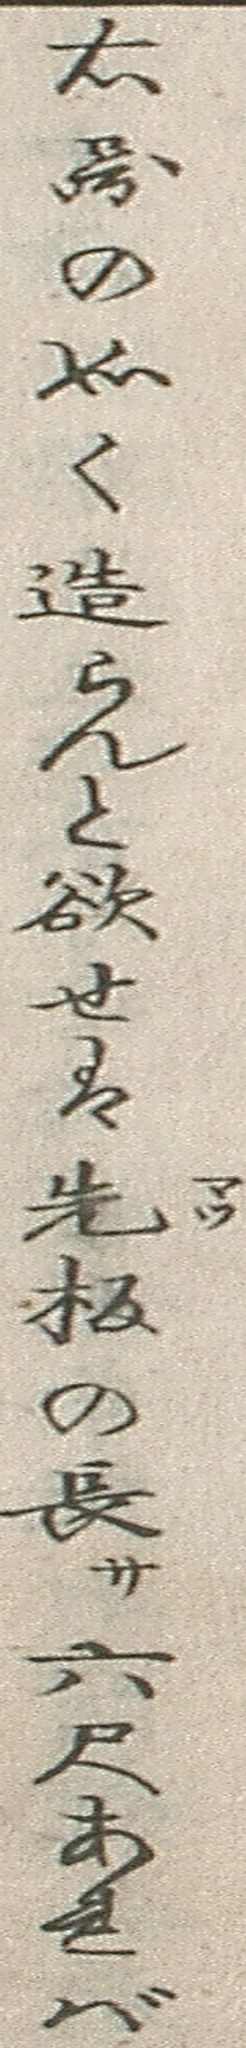右図の如く造らんと欲せは先板の長六尺あれば
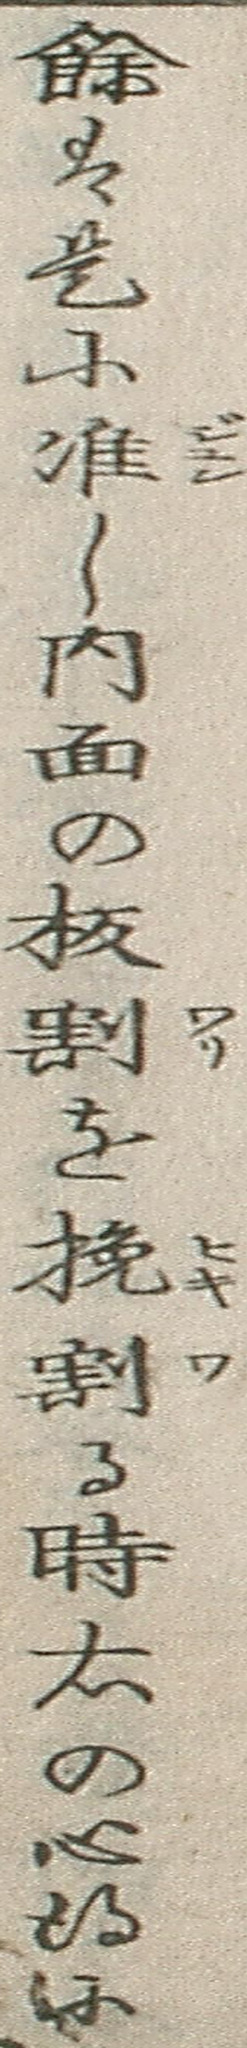余は是に准し内面の板割を挽割る時右之心得にて

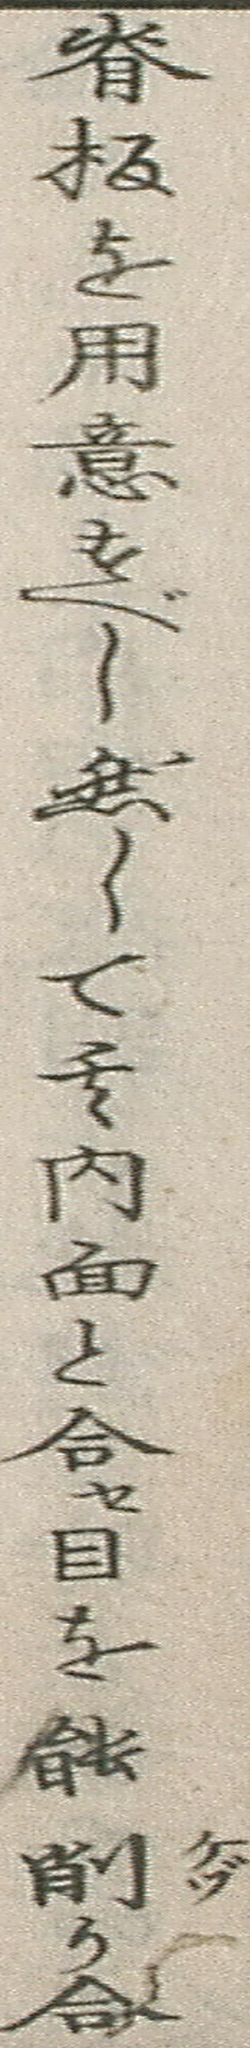背板を用意すべし然して其内面と合目を能削り合
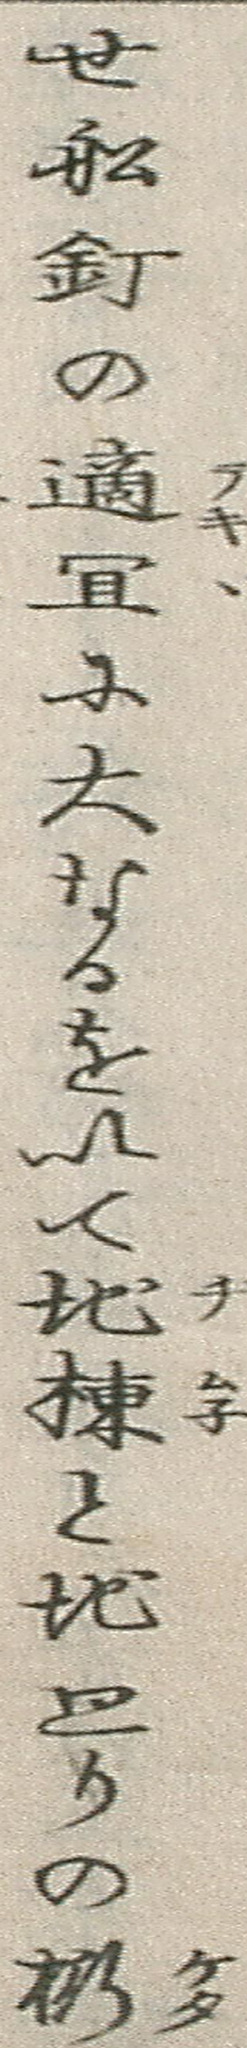せ船釘の適宜に大なるを以て地棟と地廻りの桁
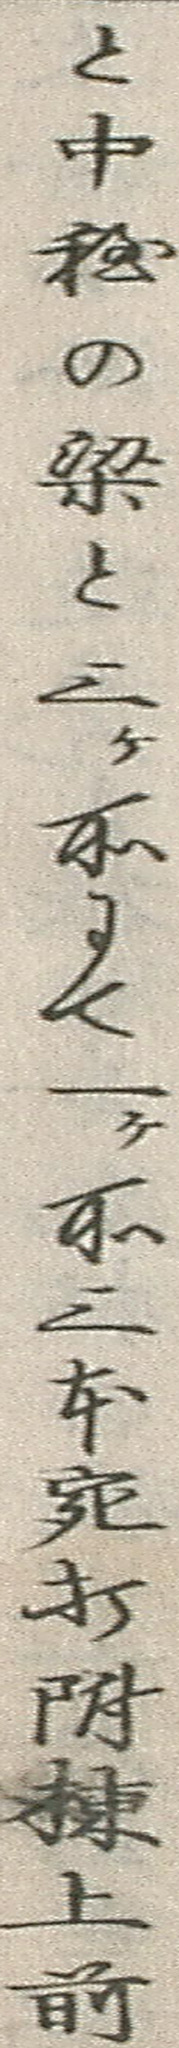と中程の梁と三ケ所にて一ケ所三本宛打附棟上前
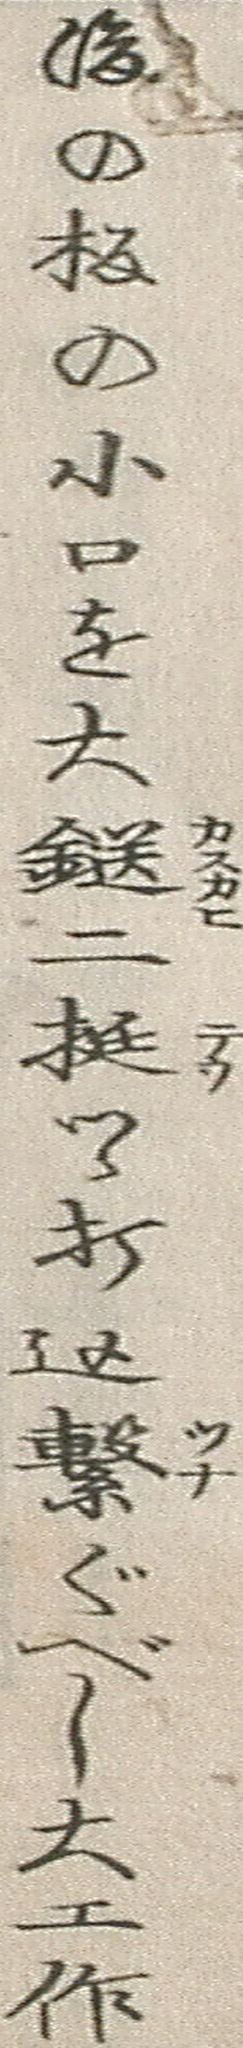後の板の小口を大鎹に挺ツヽ打込繋ぐべし大工作
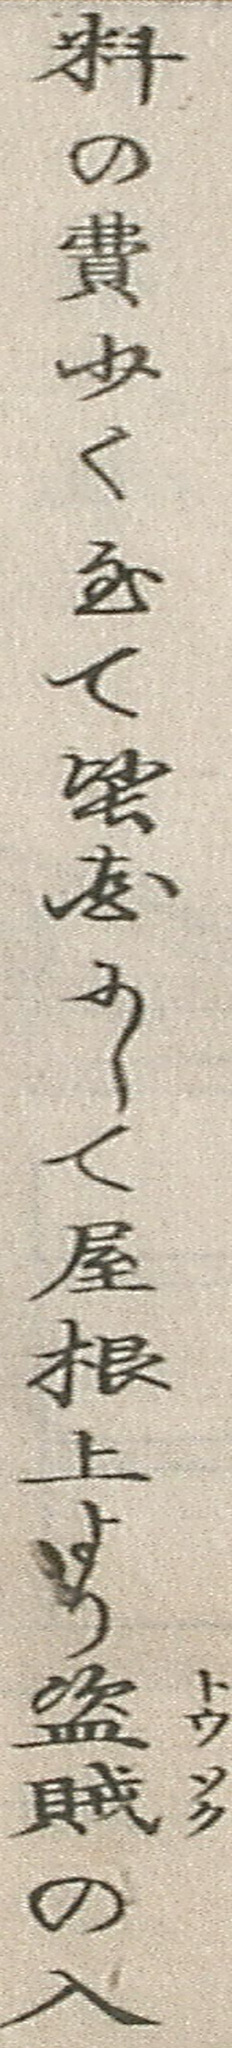料の費少く至て堅固にして屋根上より盗賊の入
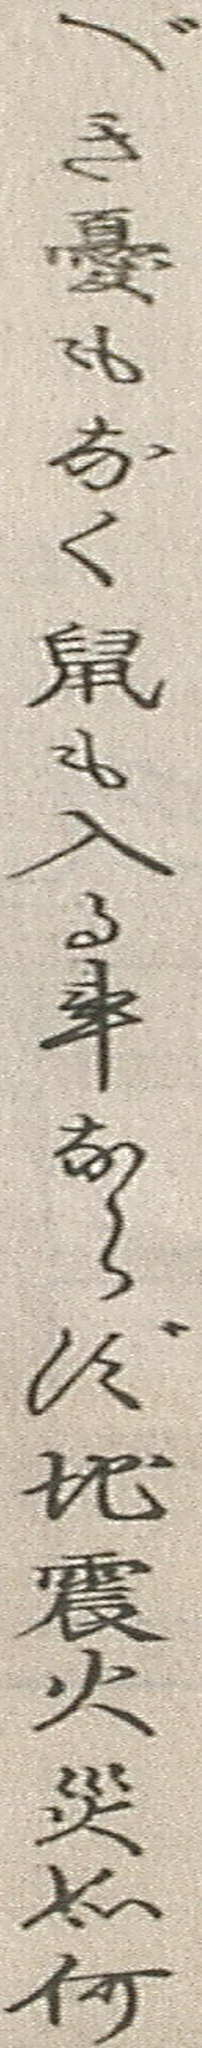べき憂もなく鼠も入る事ならず地震火災如何
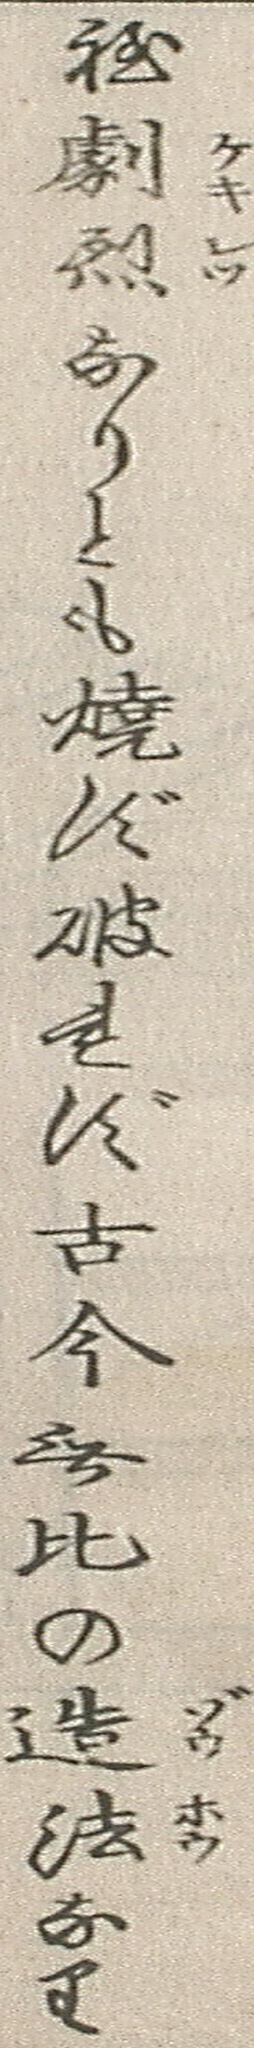程激烈なりとも焼ず破れず古今無比の造法なり
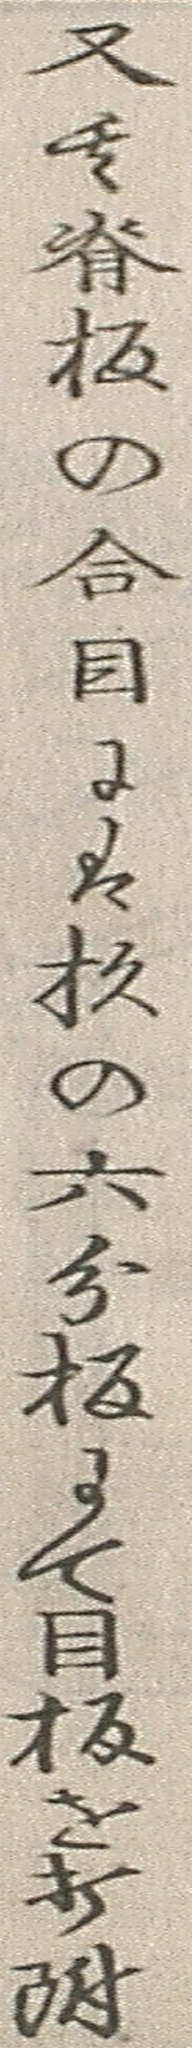又其背板の合目には杉の六分板にて目板を打附
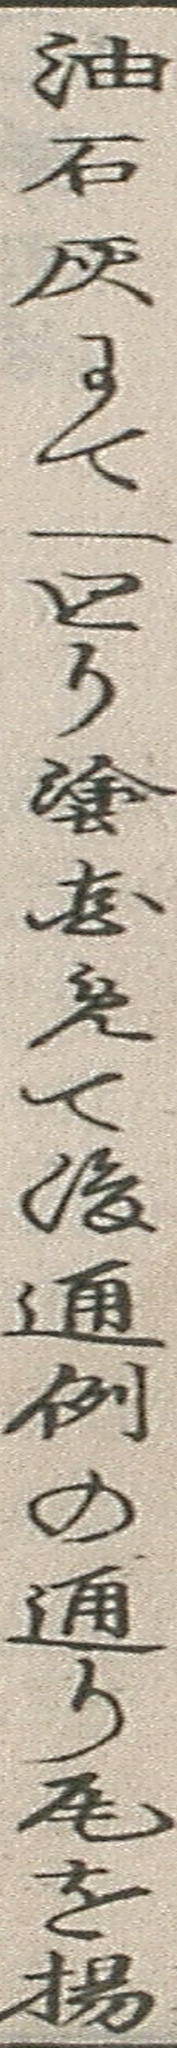油石灰にて一廻り塗固めて後通例の通り瓦を揚
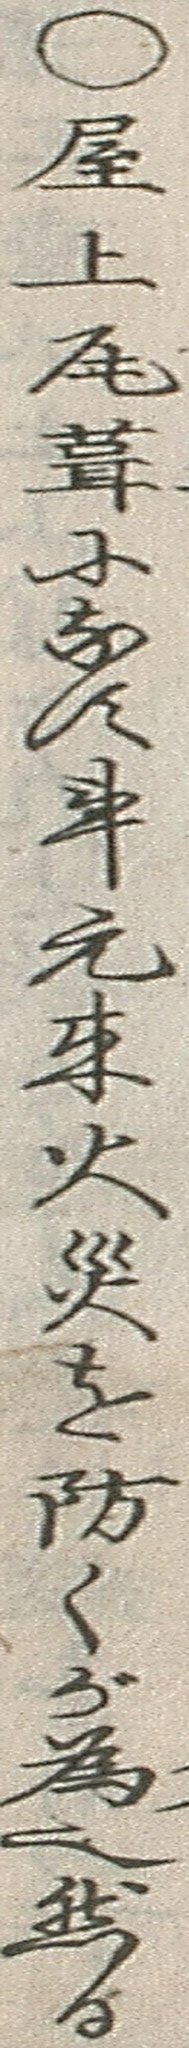〇屋上瓦葺になす事元来火災を防くが為也然る
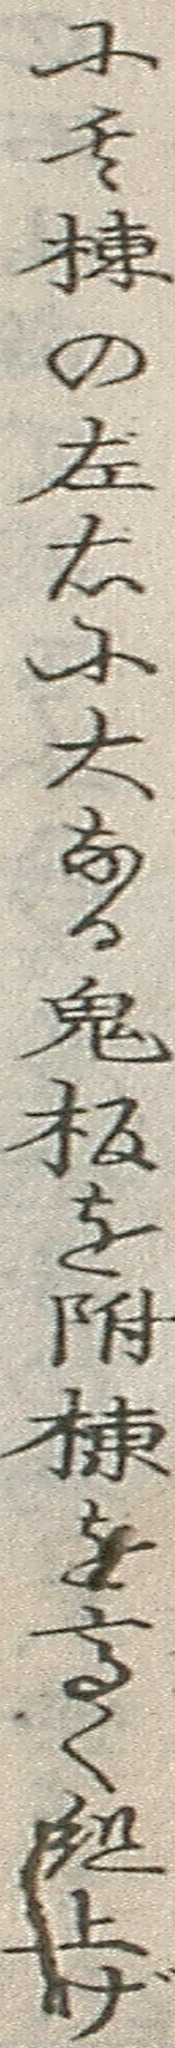に其棟の左右に大なる鬼板を附棟を高く組上げ
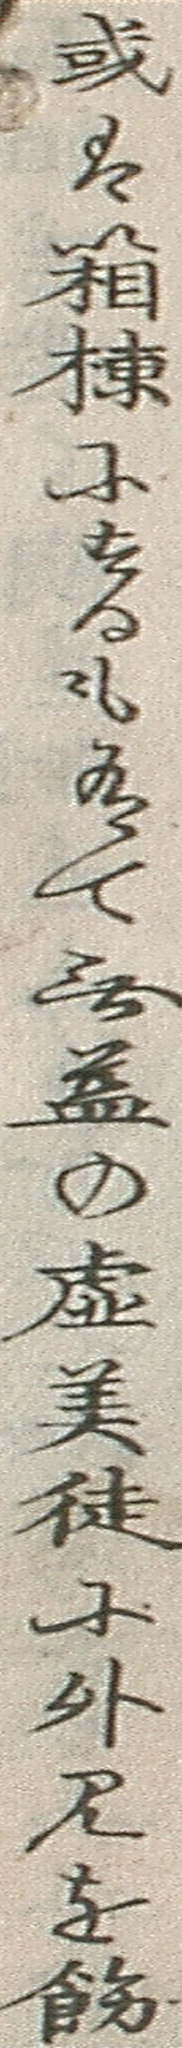或は箱棟にするも有て無益の虚美徒に外見を飾
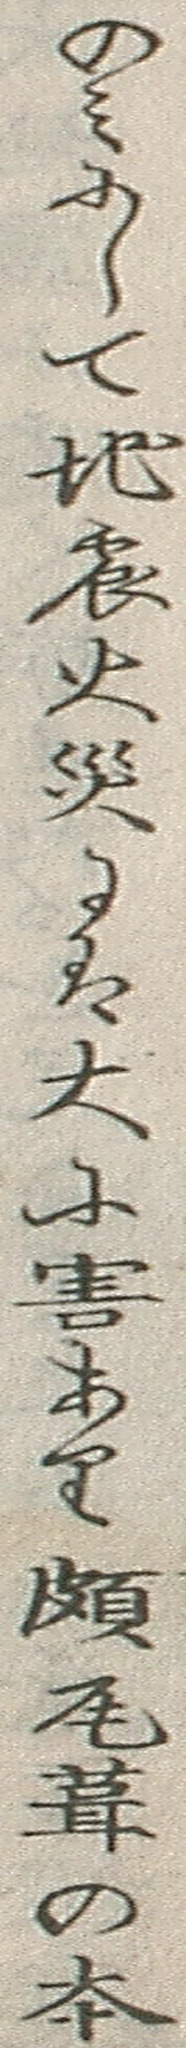のみにして地震火災には大に害あり頗瓦葺の本
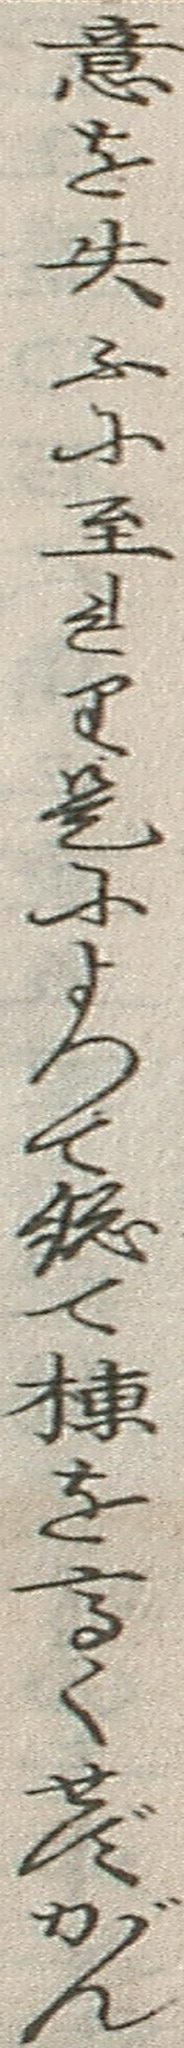意を失ふに至れり是によつて総て棟を高くせずがん
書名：附録　地震劇風災害豫防法圖説（内題）
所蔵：東京大学地震研究所図書室 Earthquake Research Institute Library, The University of Tokyo, JAPAN
